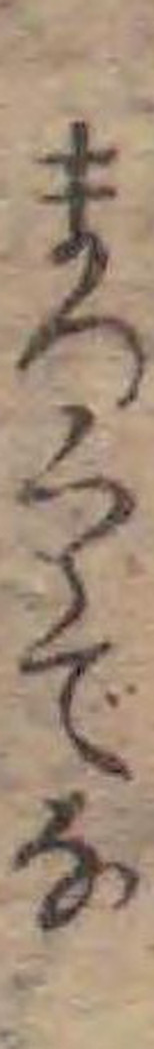まつくらてな
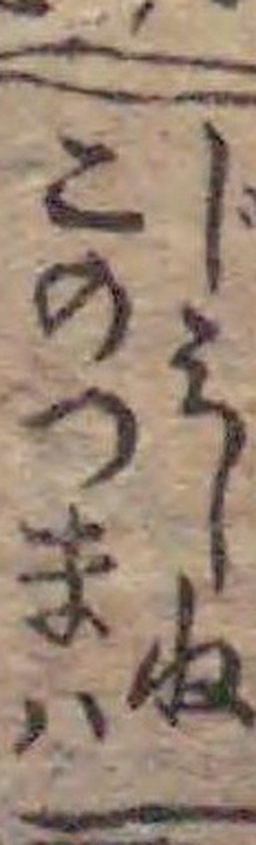このつまは
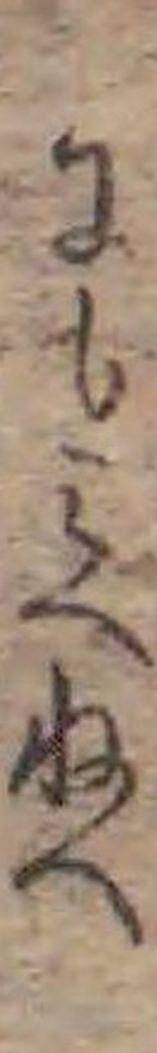にもみへねへ
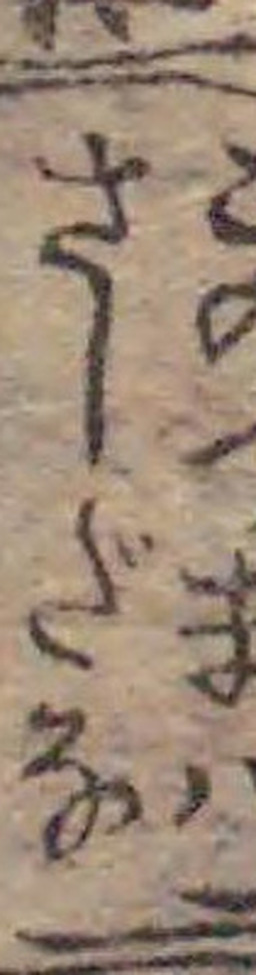さしだな
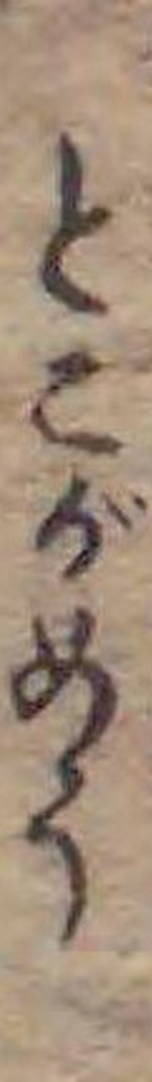とこがめう
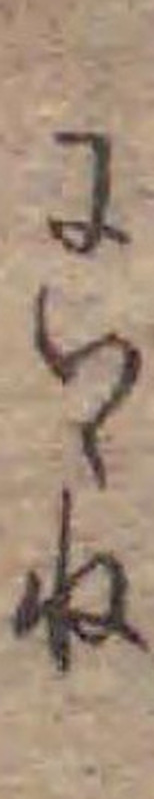にいゝね
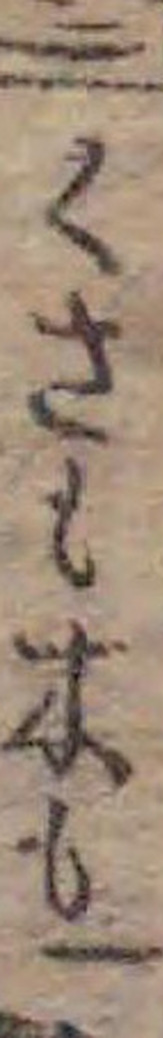くさも木も
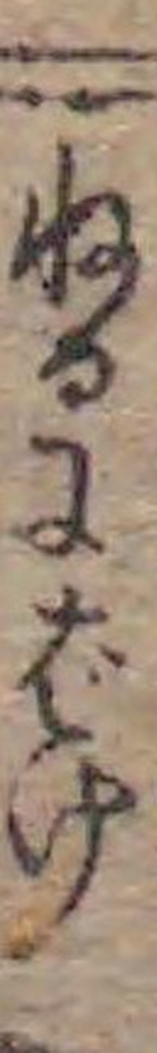ねるにばけ
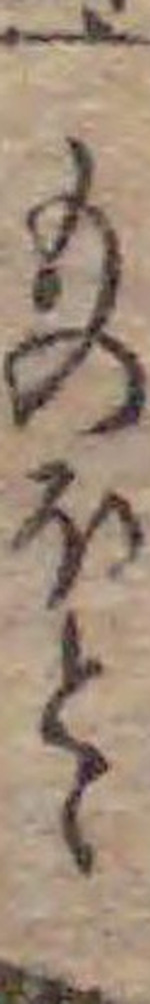ものほとゝ
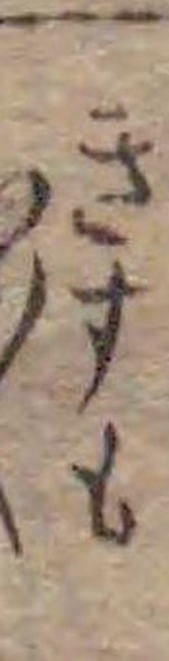きすも

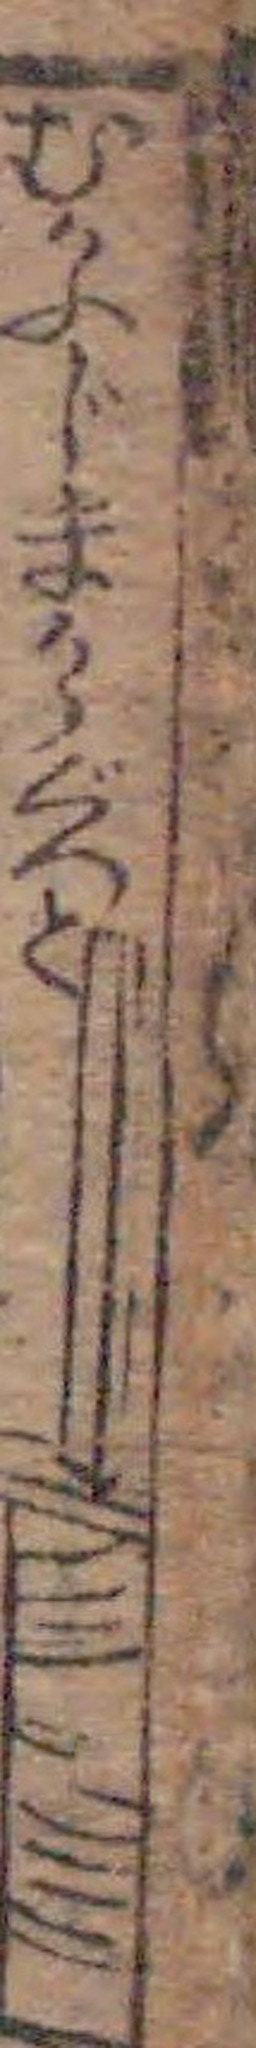むかふじまからぐつと
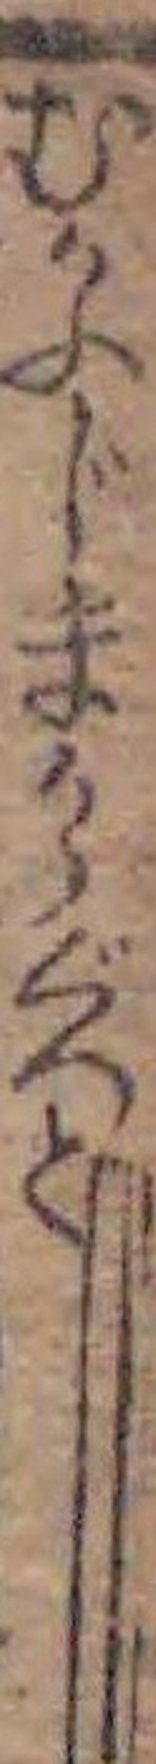むかふじまからぐつと
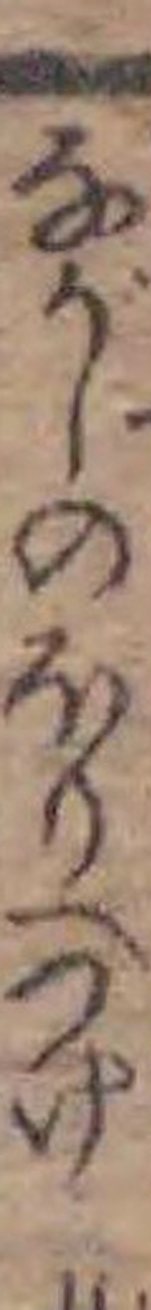ながしのほりへつけ
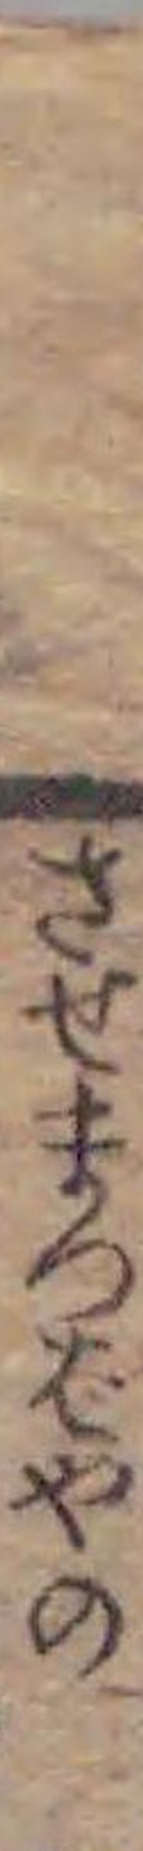させまつばやの
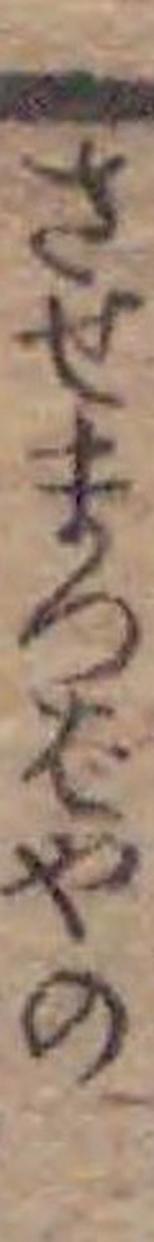させまつばやの
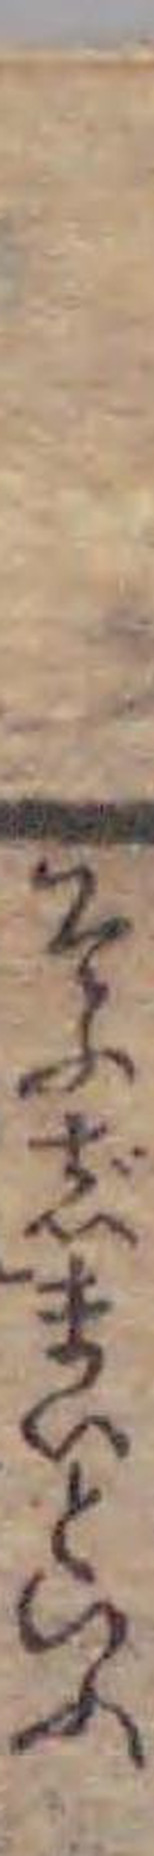そふじまいといふ
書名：化物楽屋異牒 : 2巻
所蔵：国立国会図書館 National Diet Library, JAPAN
